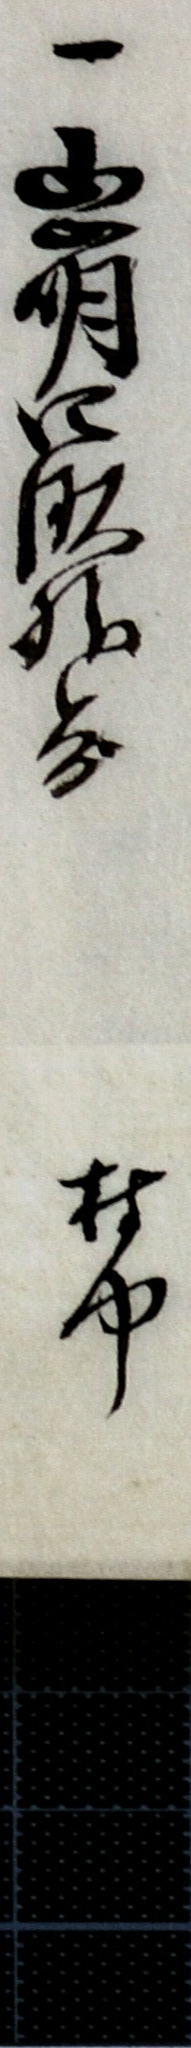一山崩四畝拾歩村中
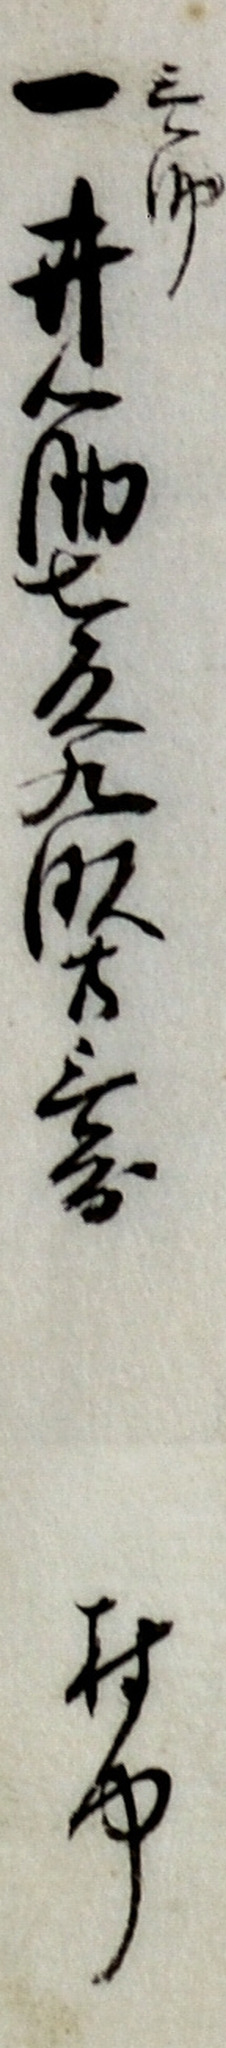一井筋七反九畝廿三歩村中
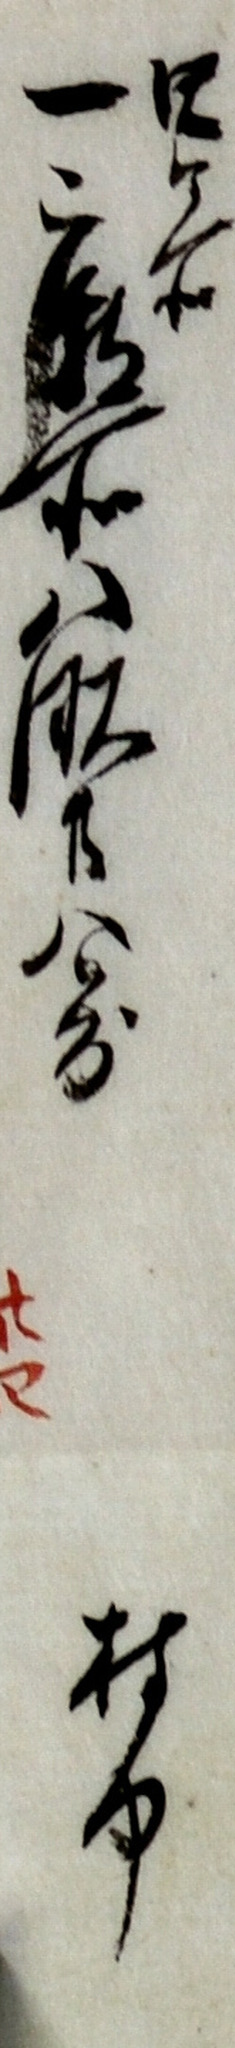一廟所八畝廿八歩村中

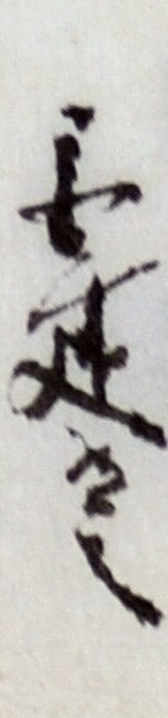宮建有之
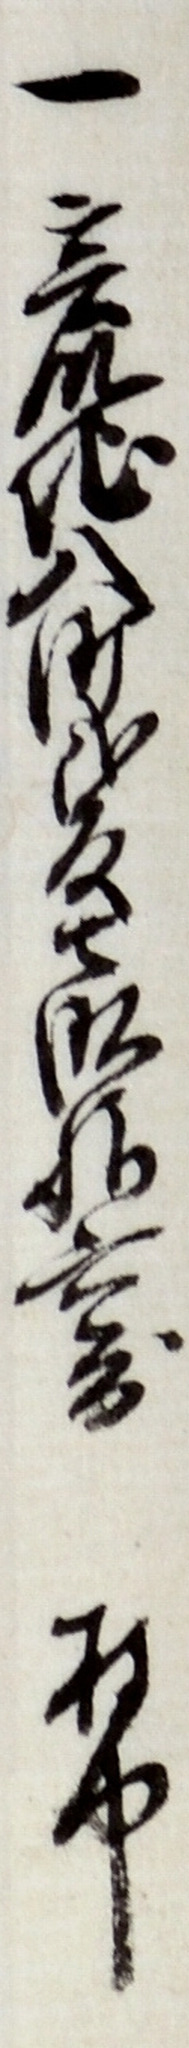一荒地八町弐反七畝拾六歩村中
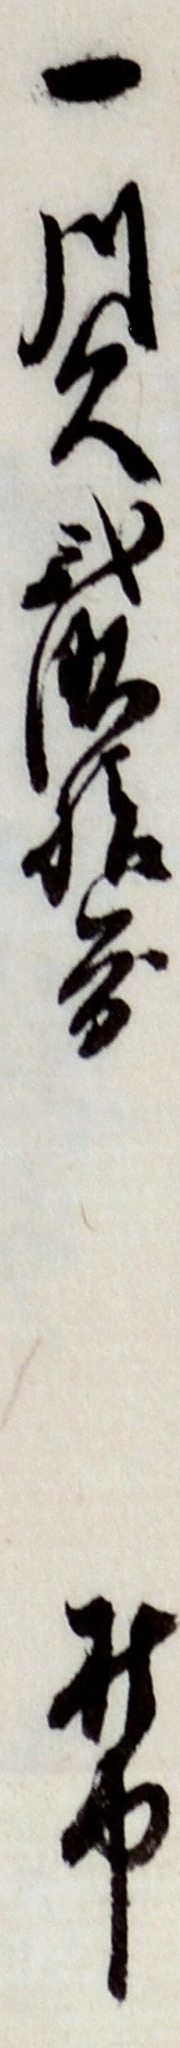一川欠弐畝拾歩村中
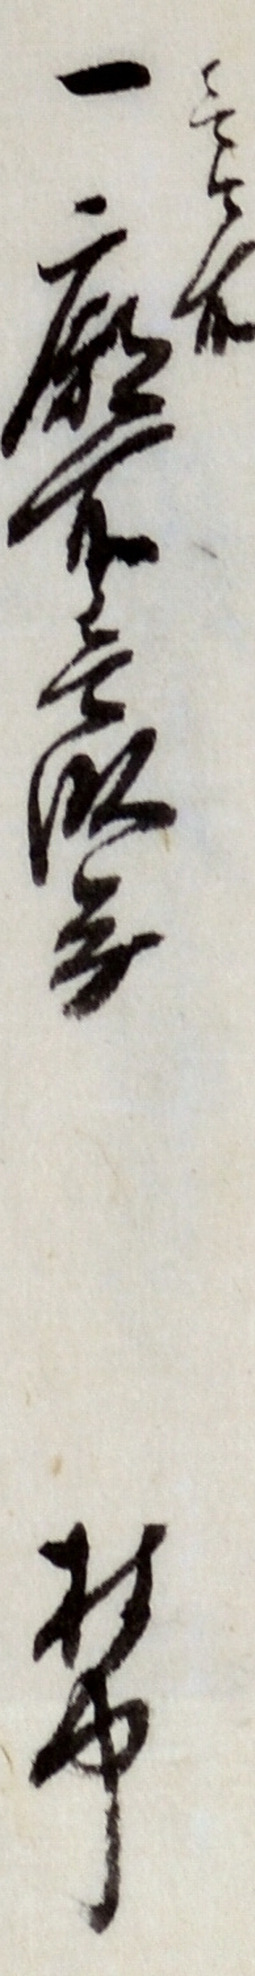一廟所壱畝歩村中
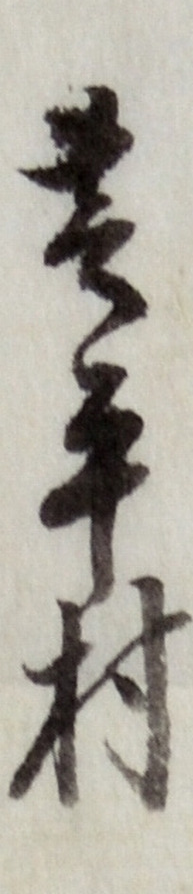芝平村
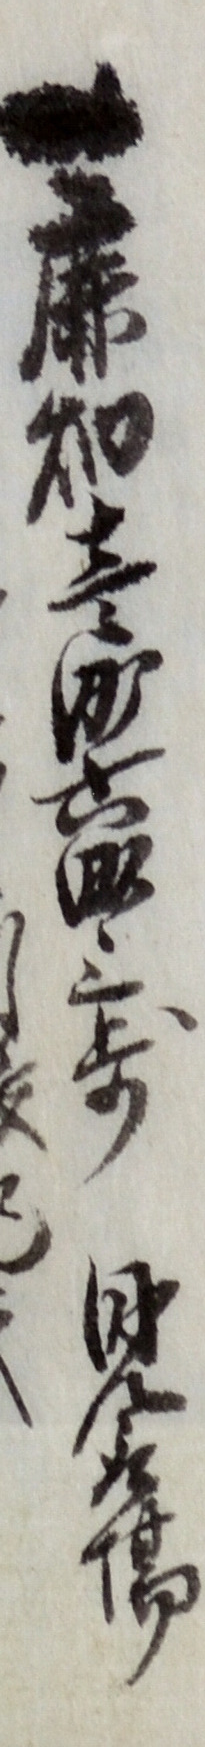一麻畑壱町六畝三歩見取場
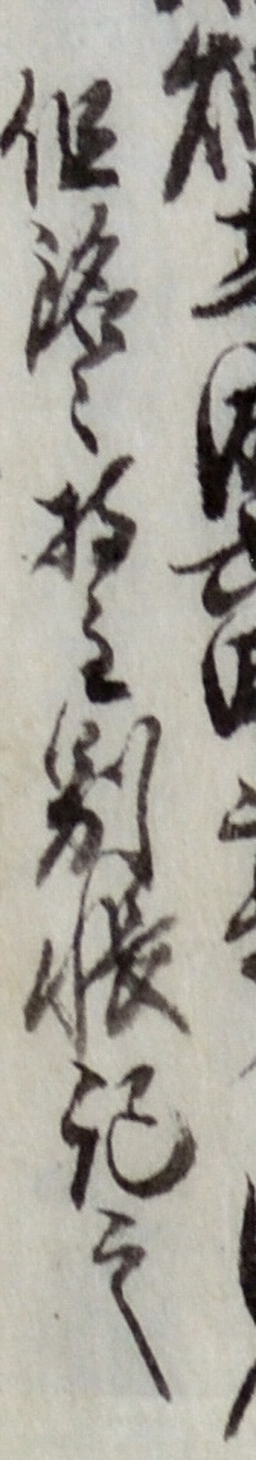但銘々持主別帳記之

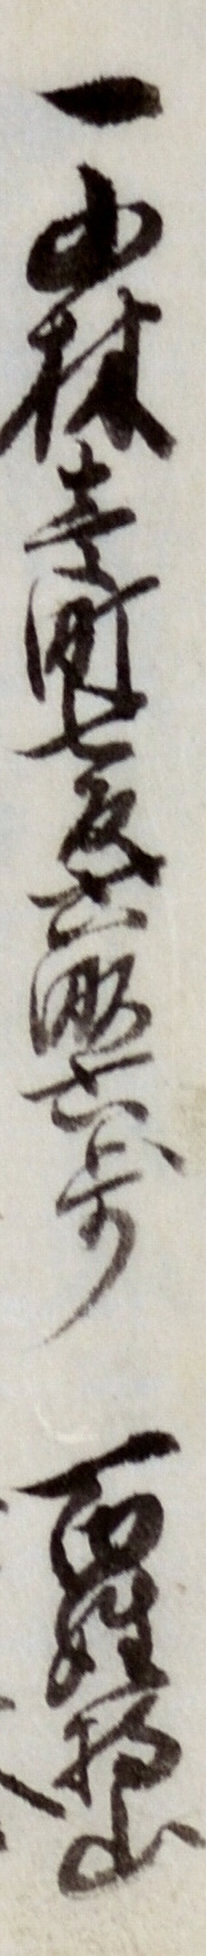一山林壱町七反六畝六歩百姓持山
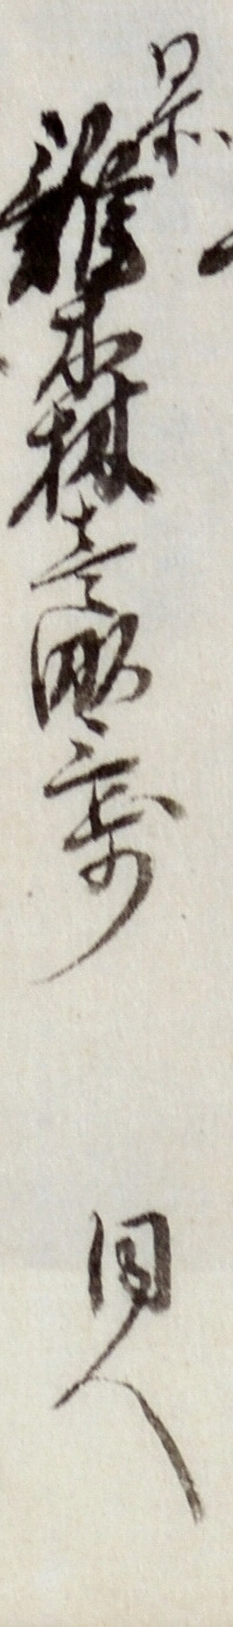雑木林壱畝三歩同人
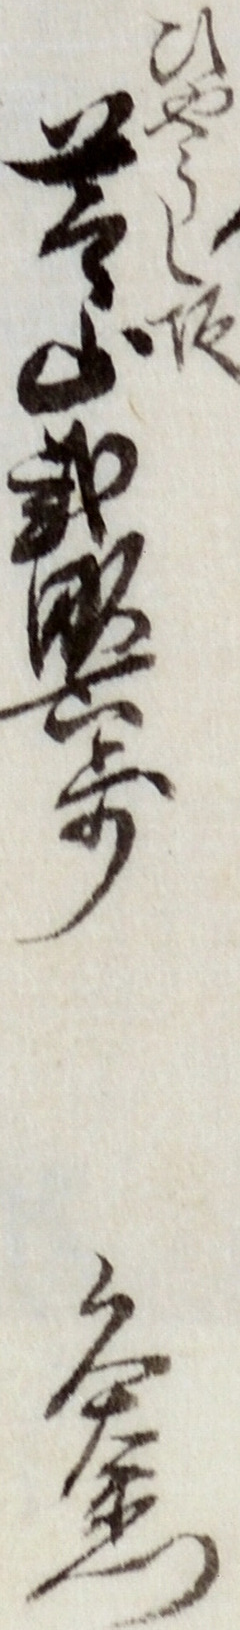芝山弐畝六歩久右衛門

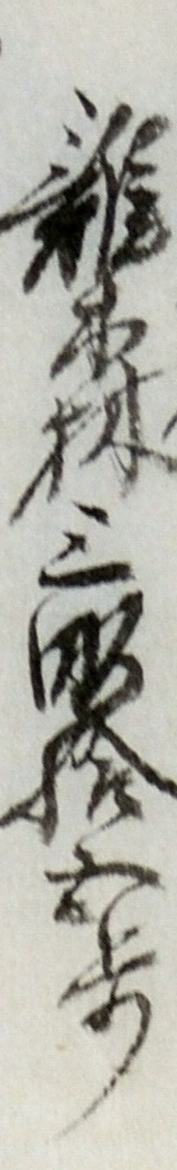雑木林三畝拾五歩同人
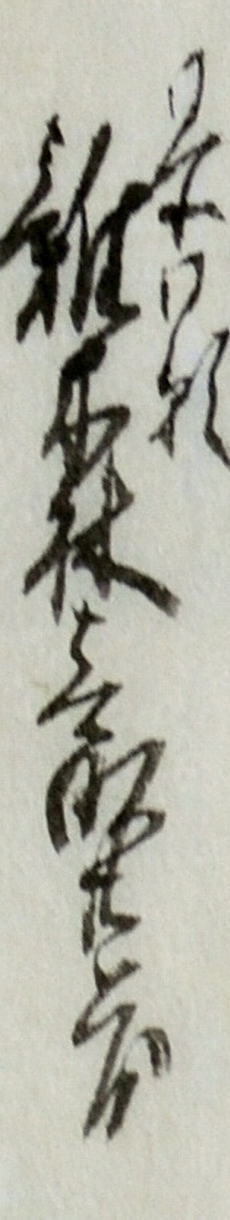雑木林三畝歩茂助
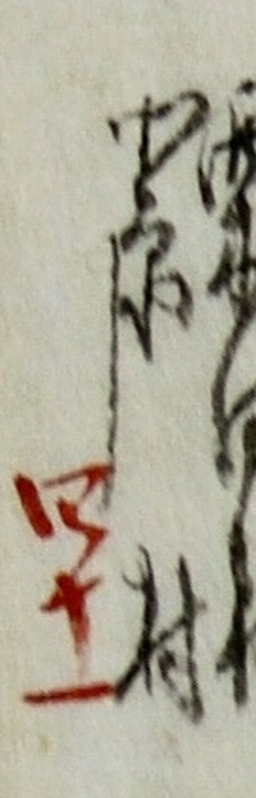四十一
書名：御領分中山林社地手控
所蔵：伊那市立高遠町図書館・合同会社AMANE
